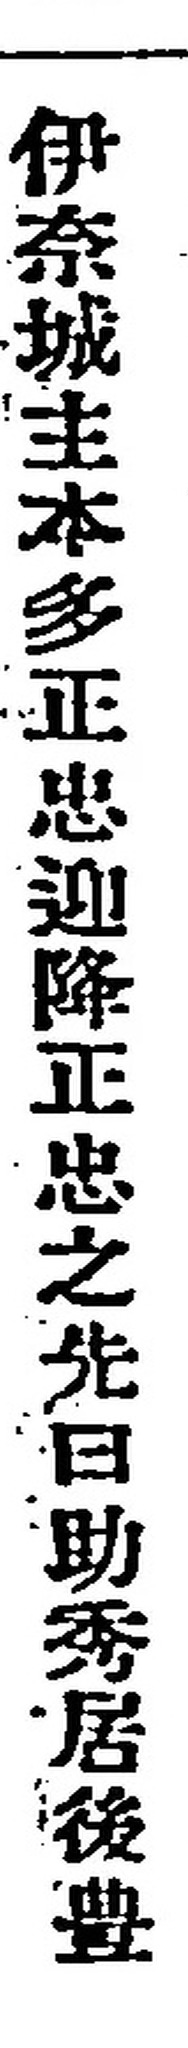伊奈城主本多正忠迎降正忠之先曰助秀居後豊
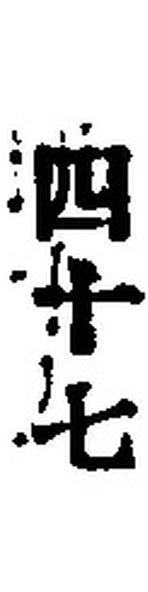四十七

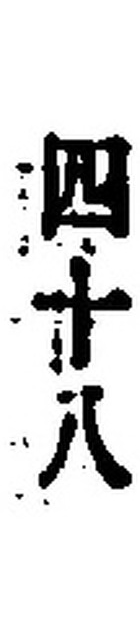四十八
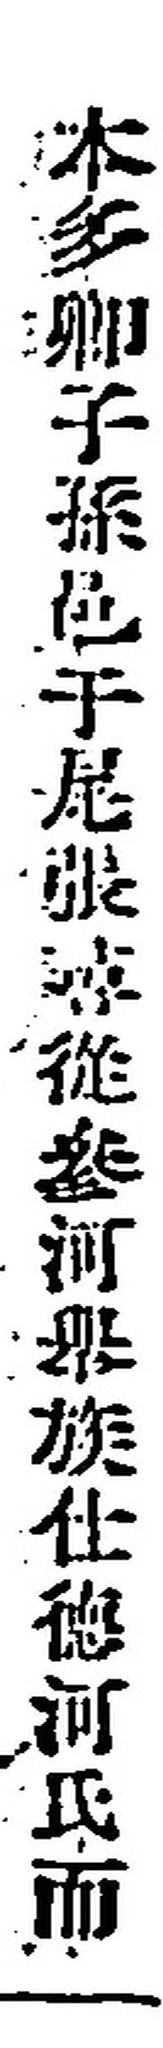本多卿子孫邑于尾張尋従参河挙族仕徳河氏而
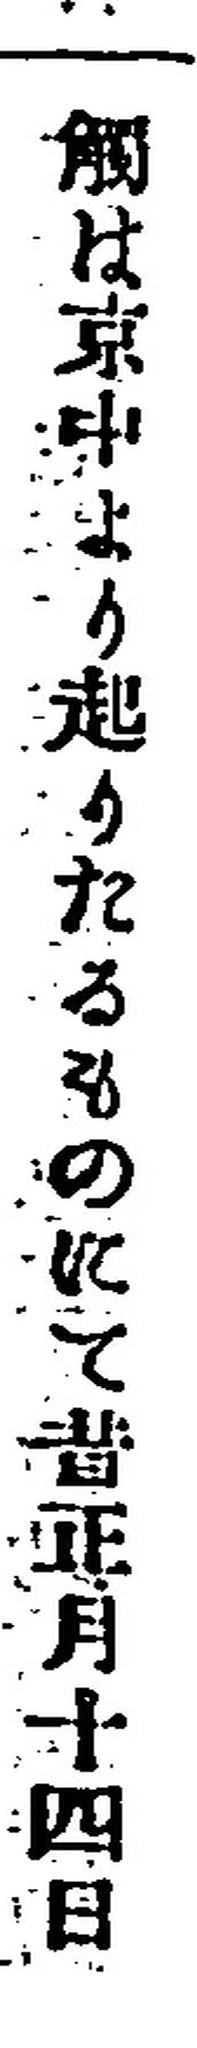触は京中より起りたるものにて昔正月十四日
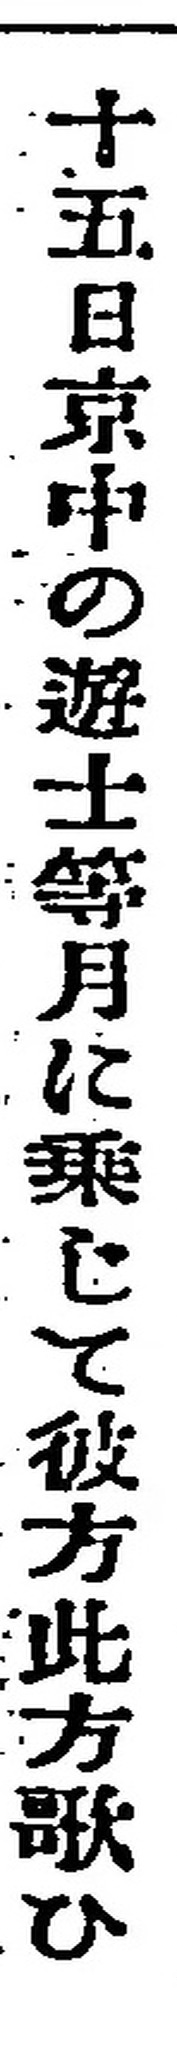十五日京中の遊士等月に乗じて彼方此方歌ひ
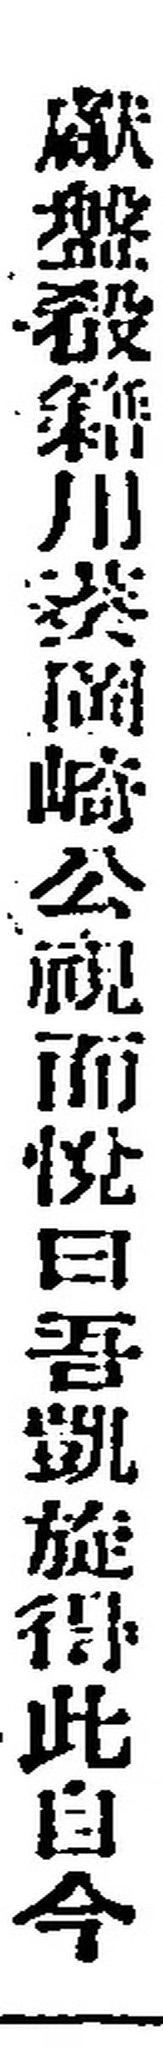献盤殽籍用葵岡崎公視而悦曰吾凱旋得此自今
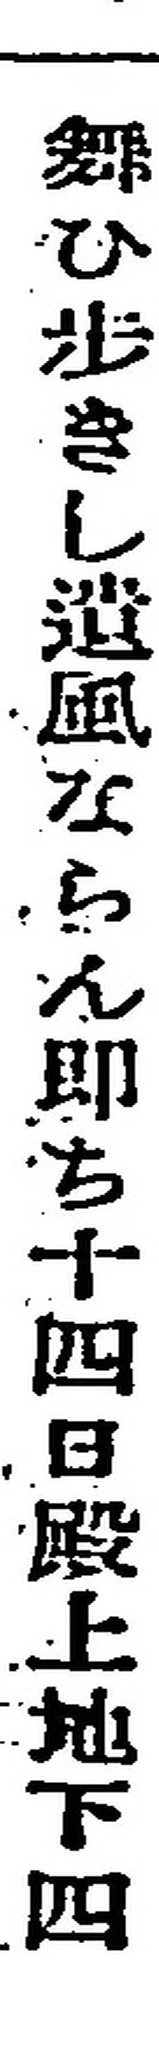舞ひ歩きし遺風ならん即ち十四日殿上地下四
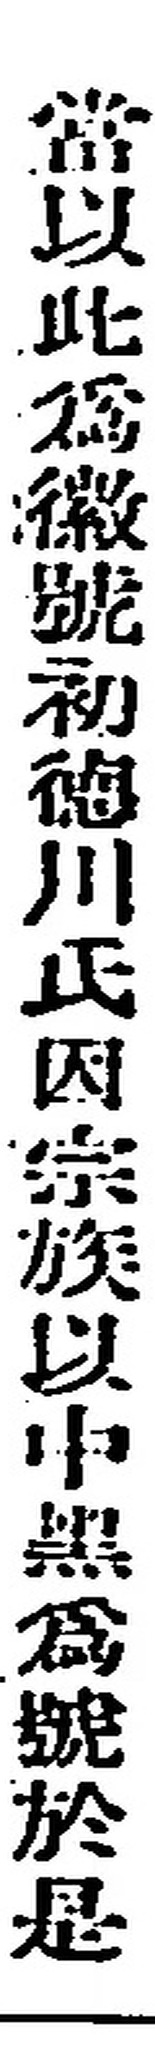当以此為徽号初徳川氏因宗族以中黒為号於是
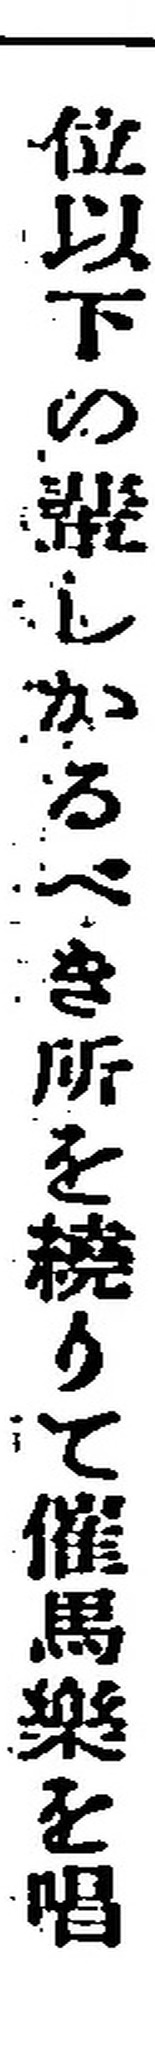位以下の輩しかるべき所を繞りて催馬楽を唱
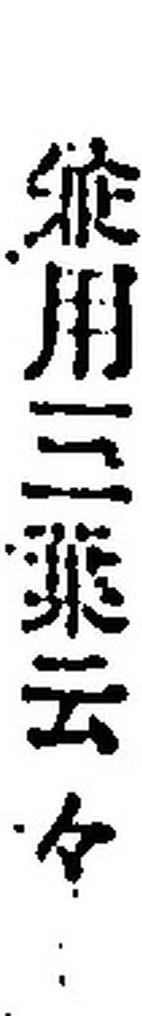兼用三葉云々
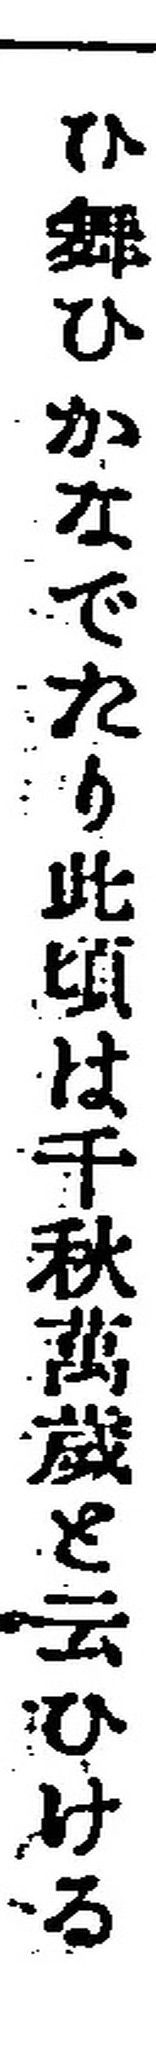ひ舞ひかなでたり此頃は千秋万歳と云ひける
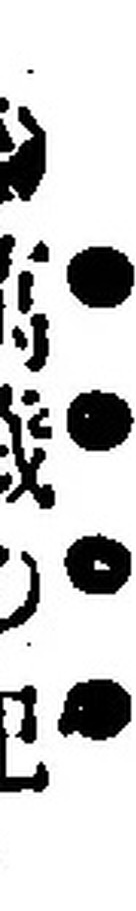●万歳の記
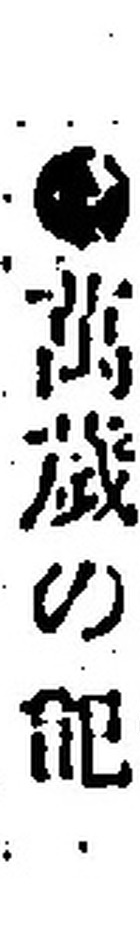●万歳の記
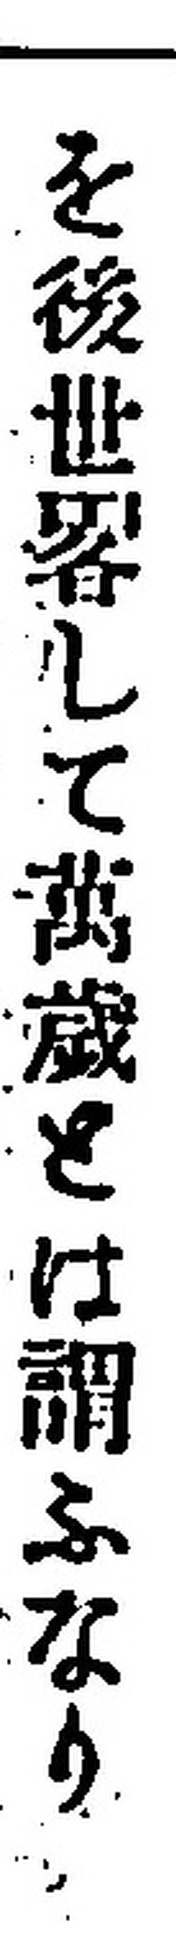を後世略して万歳とは謂ふなり
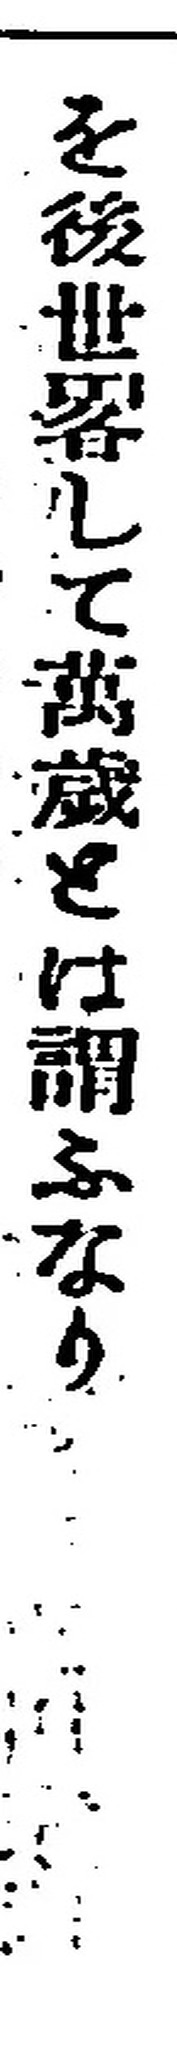を後世略して万歳とは謂ふなり
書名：東参名勝案内
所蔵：国立国会図書館 National Diet Library, JAPAN
